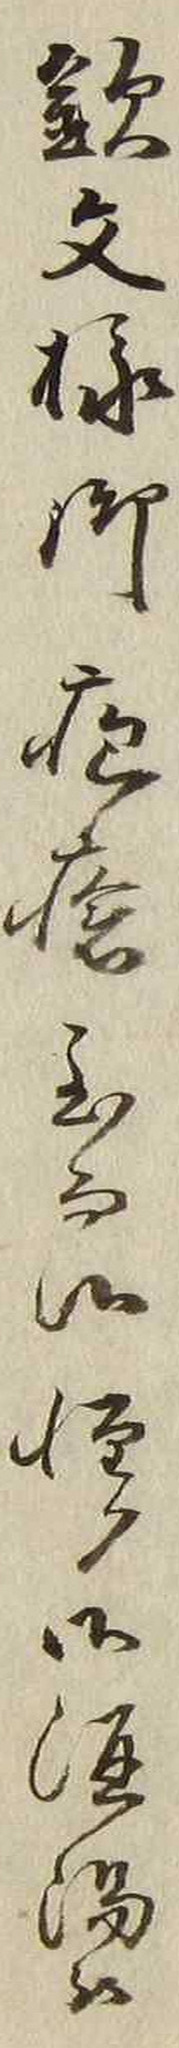欽文様御疱瘡至而御軽ク御酒湯被
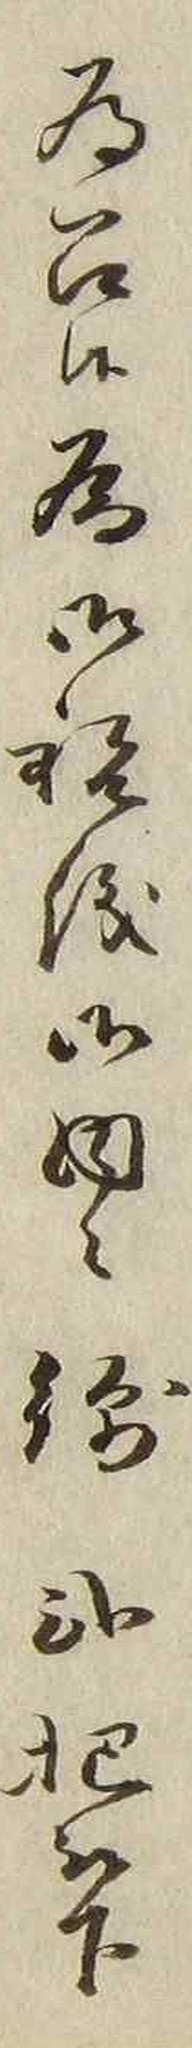為召候為御祝儀御内々綿弐把被下

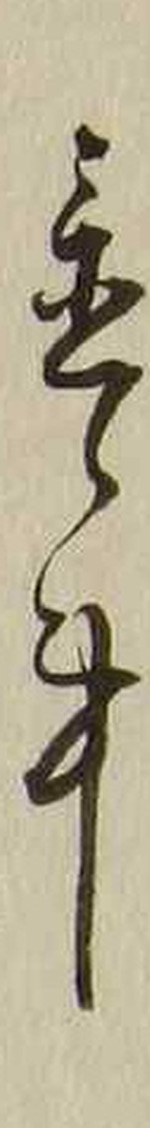置候事
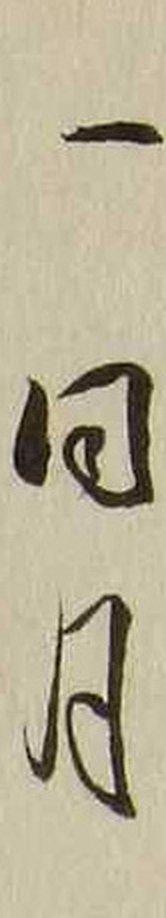一同月
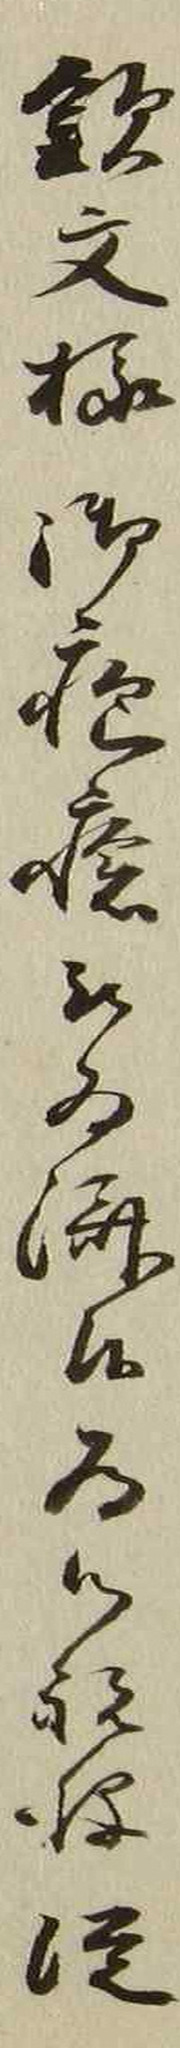欽文様御疱瘡被為済候為御祝儀従
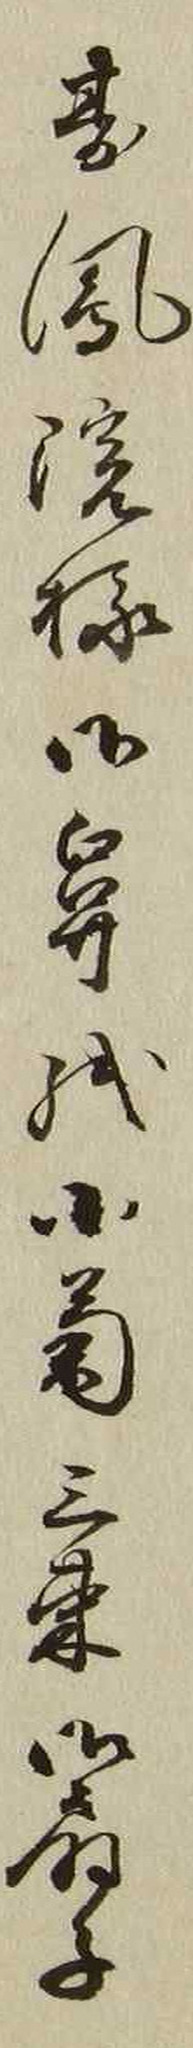寿鳳院様御鼻紙小菊三束御扇子
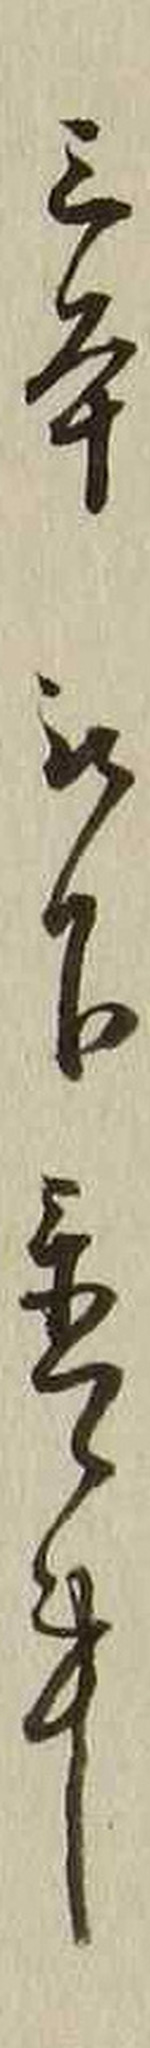三本被下置候事
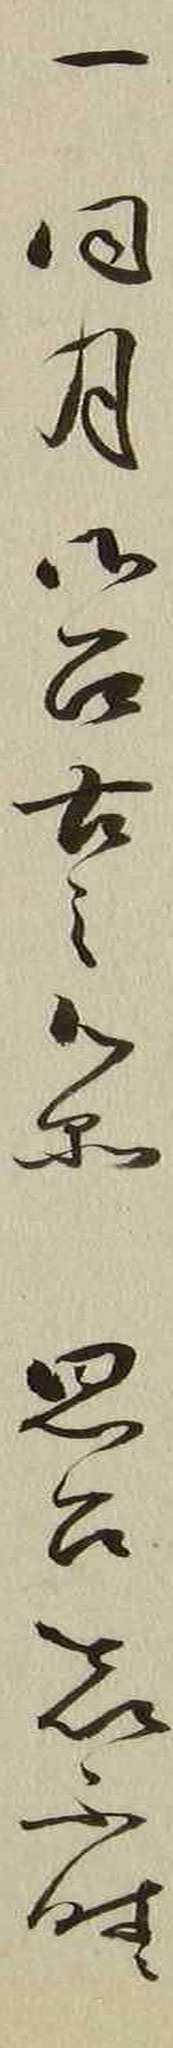一同月御召古之御品思召を以不時ニ
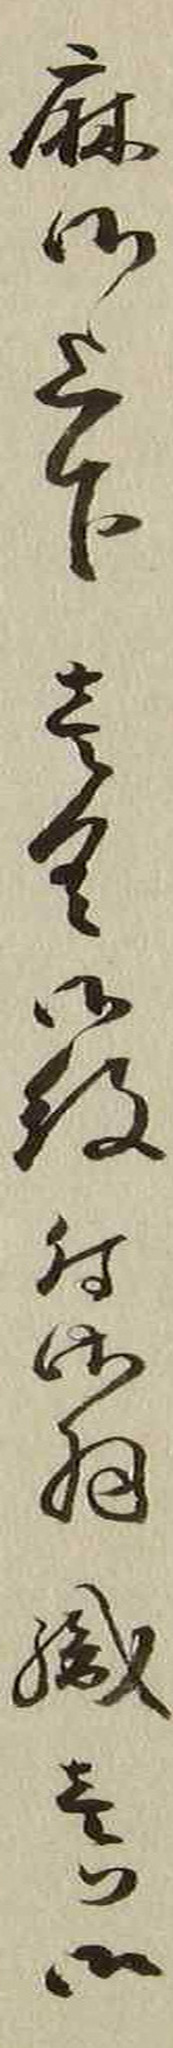麻御上下壱具御紋付御羽織壱ツ御
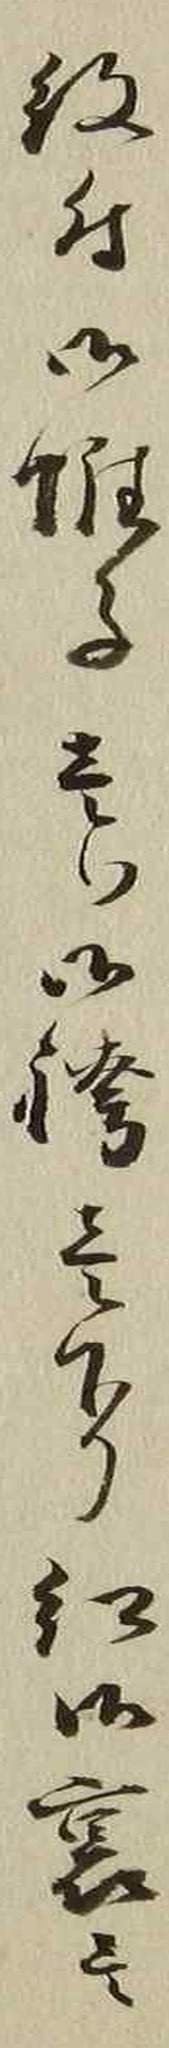紋付御帷子壱ツ御袴壱下り紅御裏壱
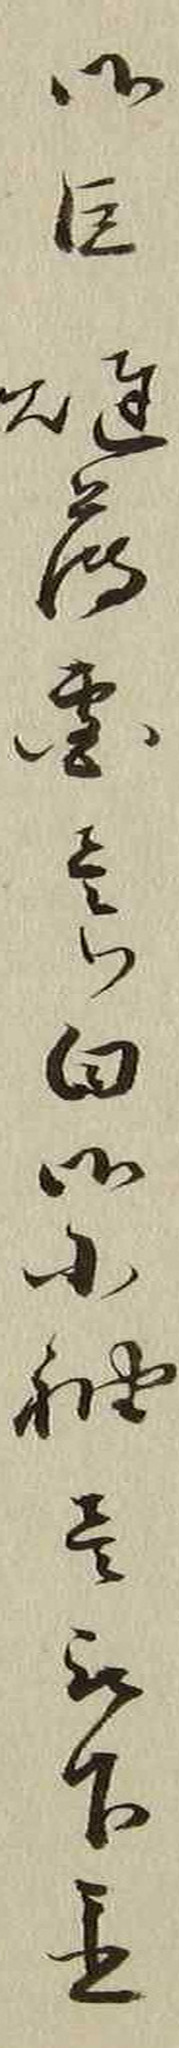御巨燵薄団壱ツ白御小袖壱被下置
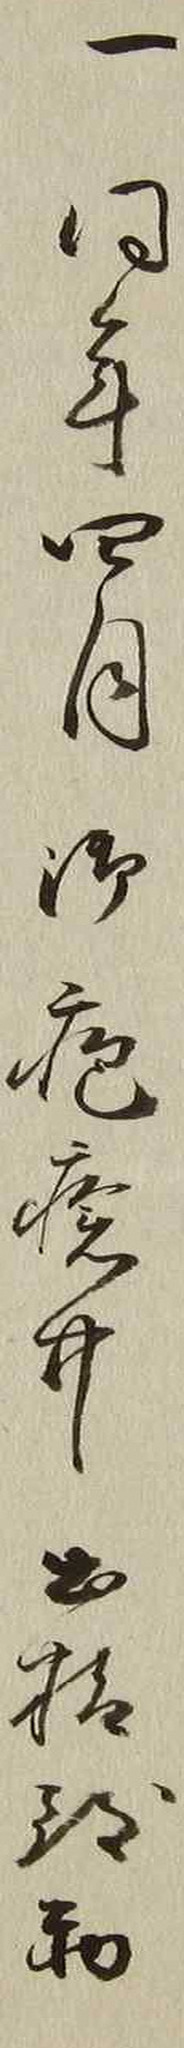一同年四月御疱瘡中出精致勤
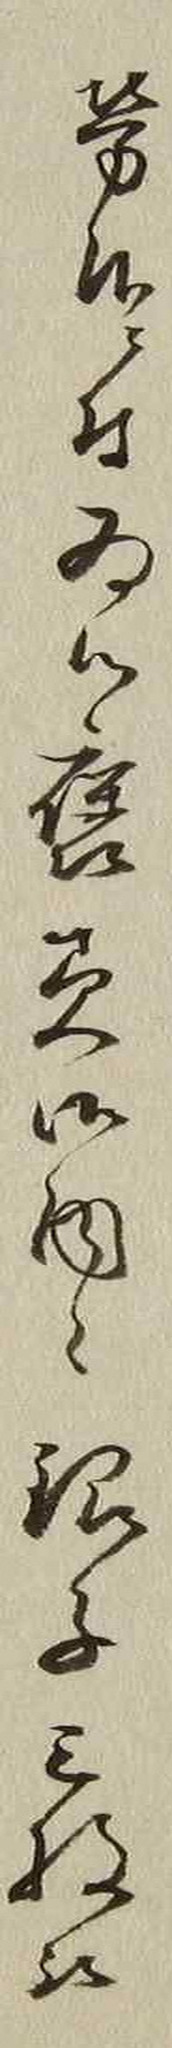労候ニ付為御褒美御内々銀子三枚被
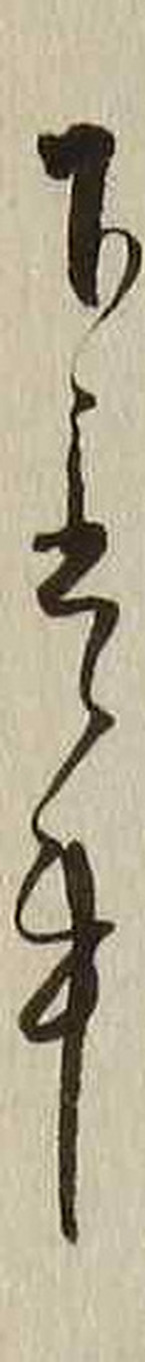下置候事
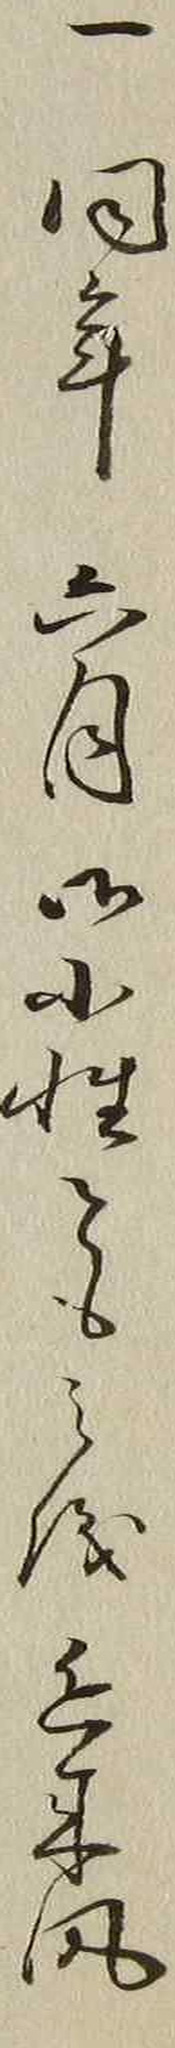一同年六月御小性とも之儀近来風
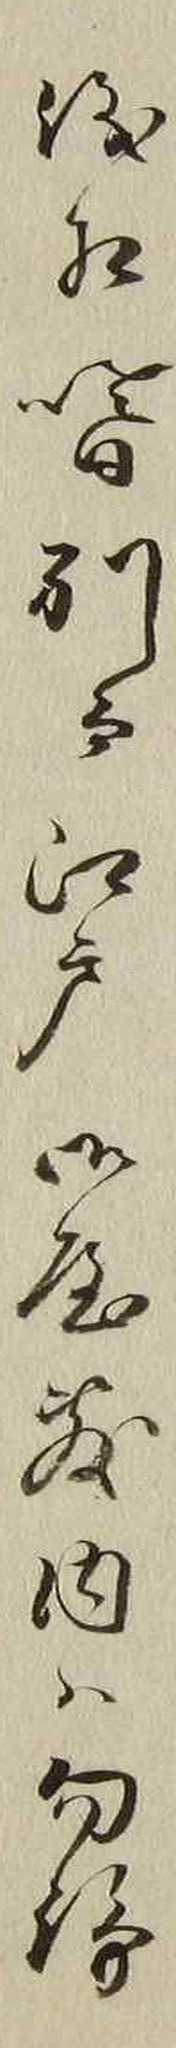儀相嗜別而江戸御屋敷内ハ勿論
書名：諸士系譜　巻之25　い之部25
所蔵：会津若松市立会津図書館
